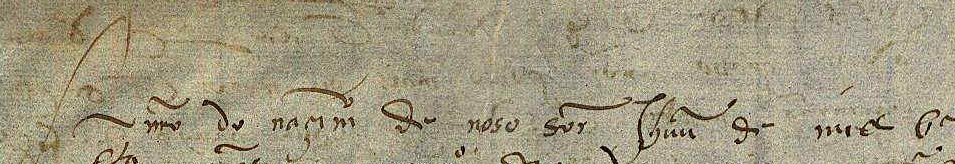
An̅no do naçimto de noso so̅r Jhu̅u de mill bc
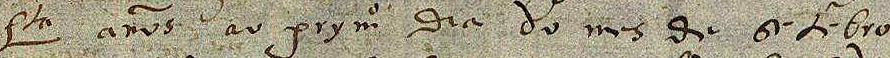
Lta an̅os ao prymo dia do mes de sete̅bro
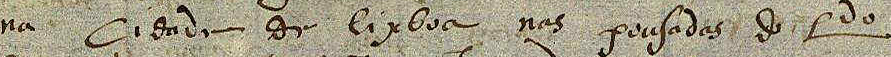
na Çidade de lixboa nas pousadas do Ldo
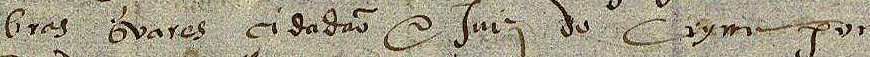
bras soares cidadão e Juiz do Cryme por
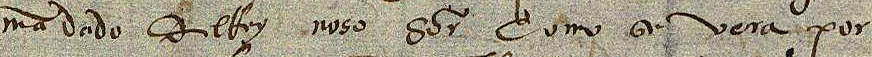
m̅adado Del Rey noso So̅r como se vera por
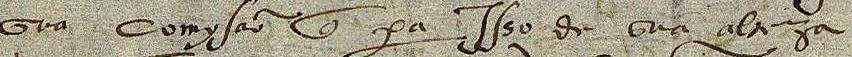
sua comysão q̅ ꝑa Jsso de sua alteza
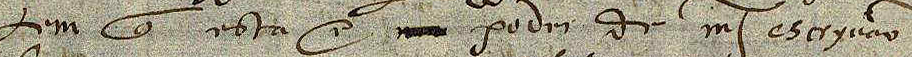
tem q̅ esta e̅ _ poder de m̄J escryuão
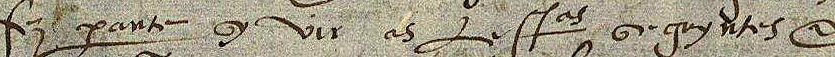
fez ꝑante sy vir as testas seguyntes e
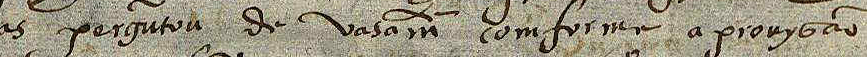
as pergu̅tou de vasamte comforme a prouysão
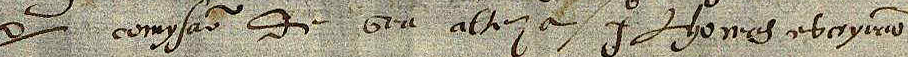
e comysão de sua alteza / po thomas escryuão
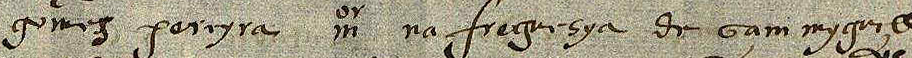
gom̅es pereyra mor na freguesya de sam myguell
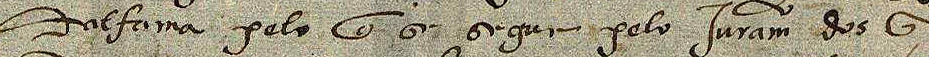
dalfama pelo q̅ se segue pelo Juramto dos s̅tos
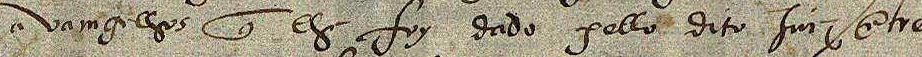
avamgelhos q̅ lhe foy dado pello dito Juiz / e̅tre
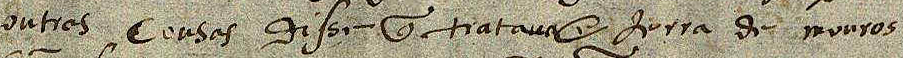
outras Cousas disse q̅ trataua e̅ terra de mouros
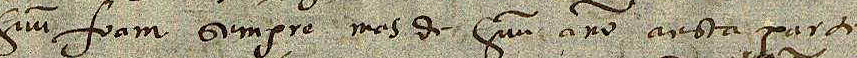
hu̅u foam sempre mas de hu̅u an̅o a esta parte
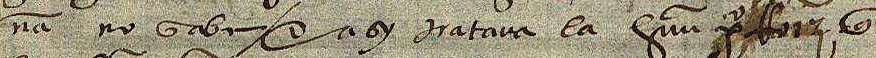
n̅a no sabe / e asy trataua la hu̅u po Ro̅iz q̅
